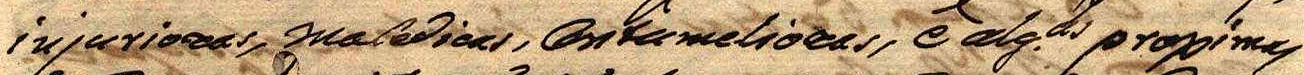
injuriozas, maledicas, contumeliozas, ê alg.as proximas
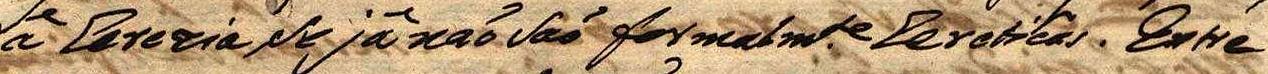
â herezia, se jâ naõ saõ formalm.te hereticas. Entre
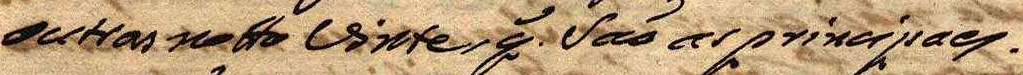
outras notto vinte, q̄. saõ as principaes.
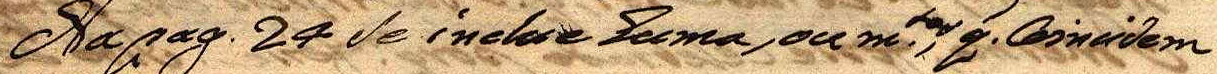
Na pag. 24 se inclue huma, ou m.tas, q̄. Coincidem
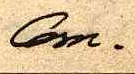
Com
